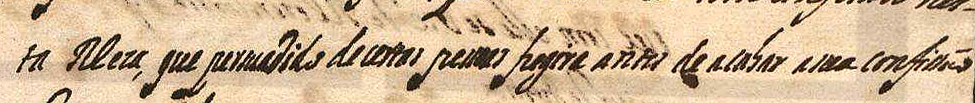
ta Meza, que persuadido de certas pessoas fugira antes de acabar a sua confissaõ
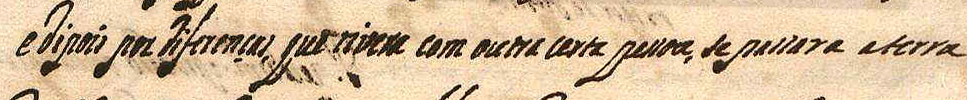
e dipois por diferenças, que vivera com outra certa pessoa, se passara a terra
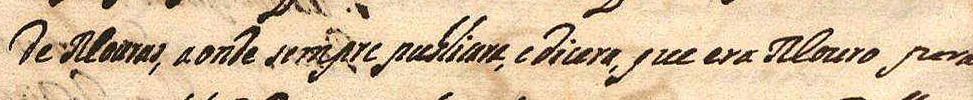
de Mouras, aonde sempre publicara, e dicera, que era Mouro para
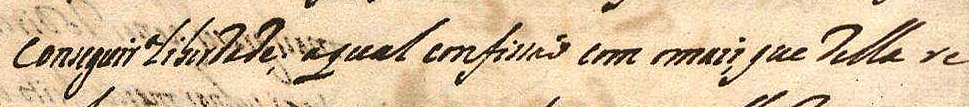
conseguir a Liberdade; a qual confissaõ com mais, que della re
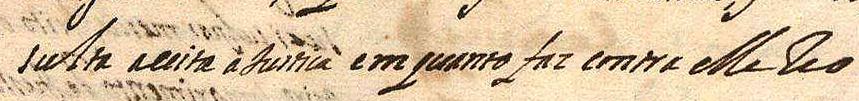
sulta aceita à Iustiça emquanto faz contra elle Reo
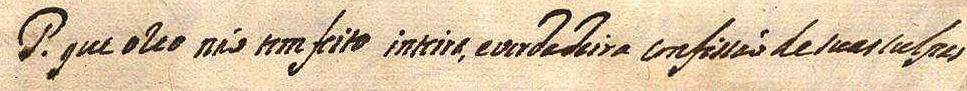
P. que o Reo naõ tem feito inteira, e verdadeira confissaõ de suas culpas
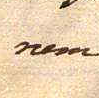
nem
